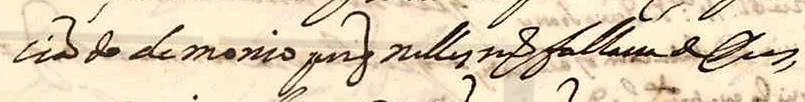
cia do demonio porq̄ nelles não fallaua de Deos,
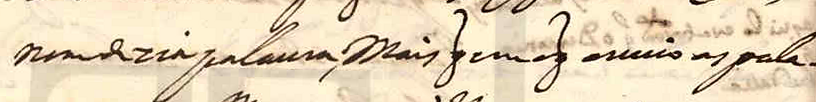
nem dizia palaura, mais q̄ em o q̄ ouuio as pala
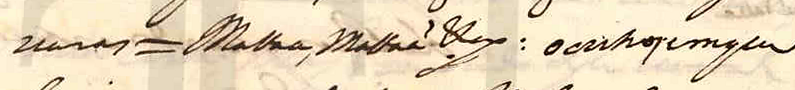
uaras = Mattaa, Mattaa &cꝭ: o outros em que
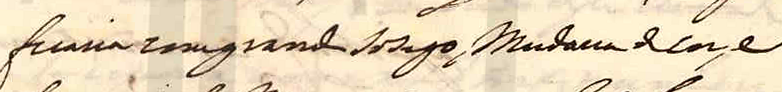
ficaua com grando sosego, mudaua de cor, e
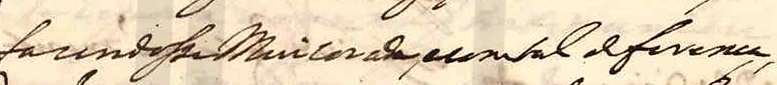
fazendosse Mui corada, e com tal deferença
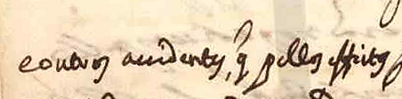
e outros accidentes, q̄ pellos effeitos
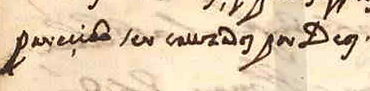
pareciaõ ser cauzados por Deos
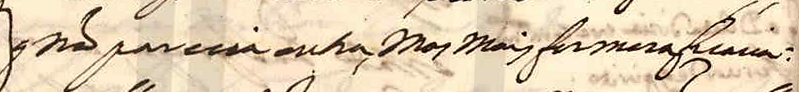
q̄ naõ parecia outra, mas mais fermoza ficaua
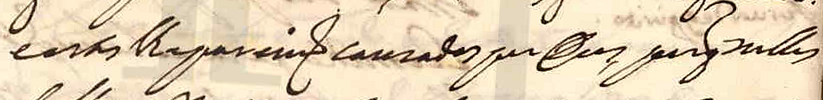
e estes lhe pareciaõ cauzados por Deos, porq̄ nelles
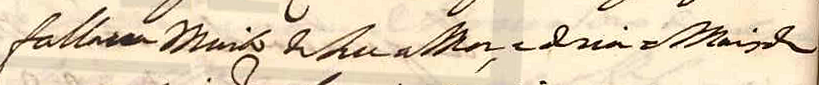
fallaua muito de seu amor, e dezia e mais de
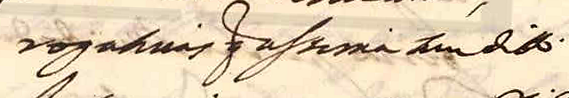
rogatiuas q̄ assima tem ditto.
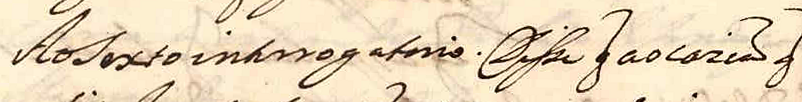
Ao Sexto interrogatorio. Disse q̄ a ocaziaõ q̄
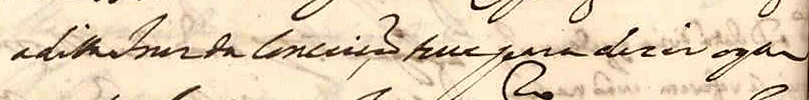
a ditta Ines da Conceiçaõ teue para dizer o que
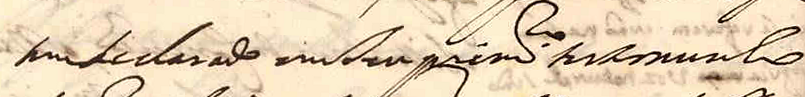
tem declarado em seu prim.ro testemunho
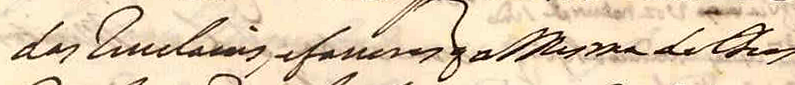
das Reuelaçois, e fauores q̄ a mesma de Deos
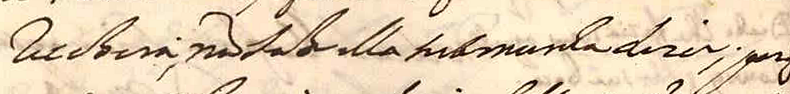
Recebera, naõ sabe ella testemunha dizer, porq̄
